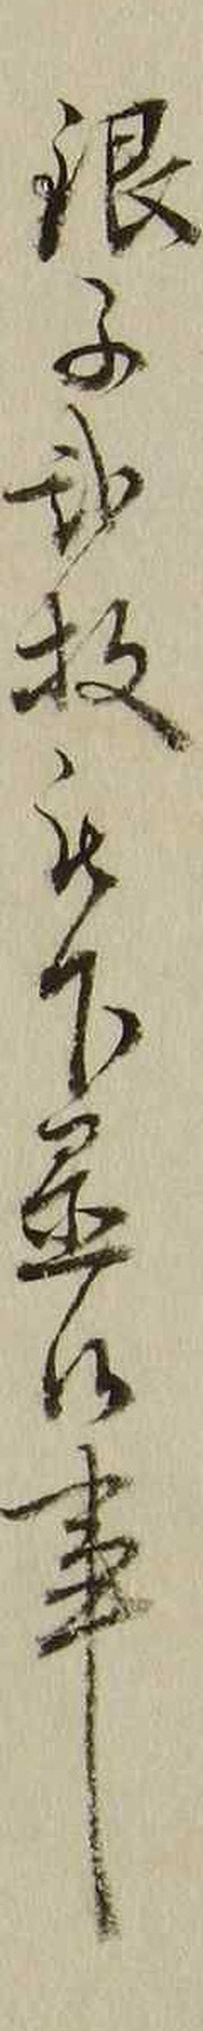銀子弐枚被下置候事
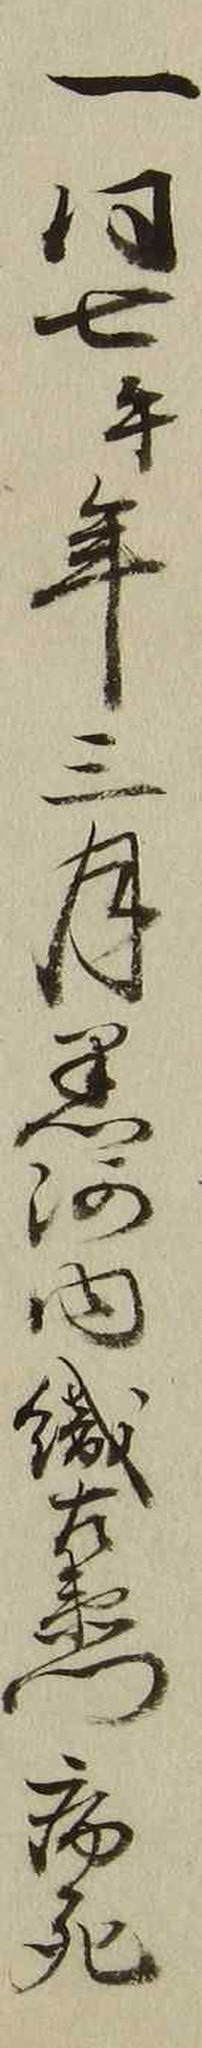一同七午年三月黒河内織左衛門病死
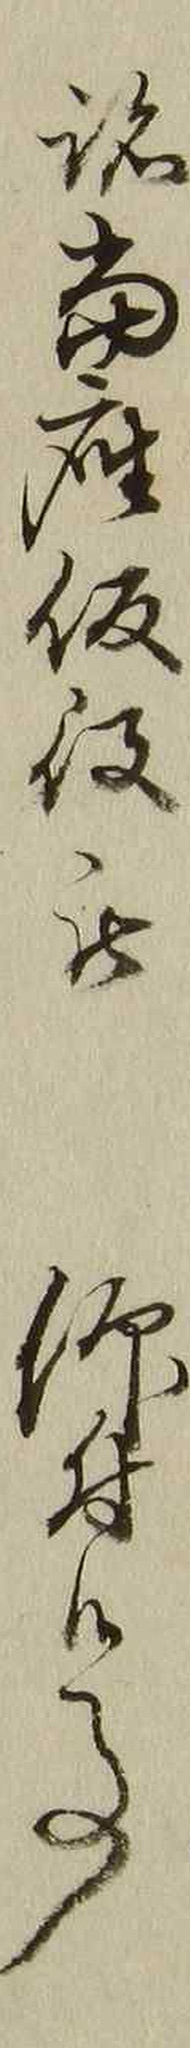跡当座仮役被仰付候事
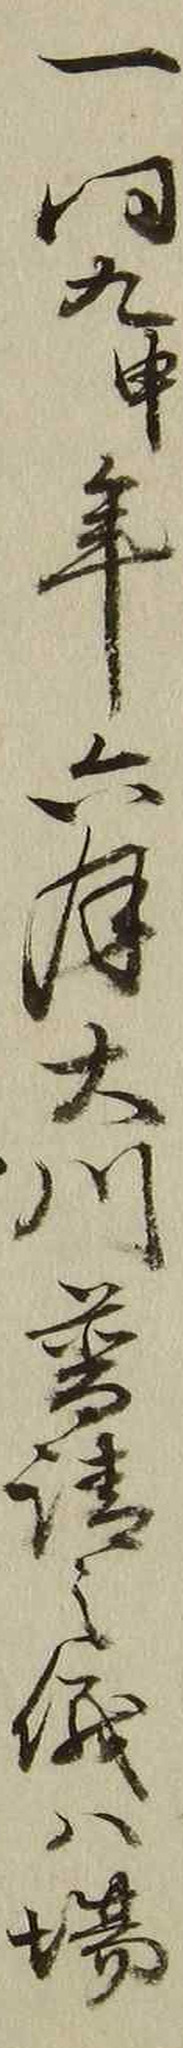一同九申年六月大川普請之儀ハ場
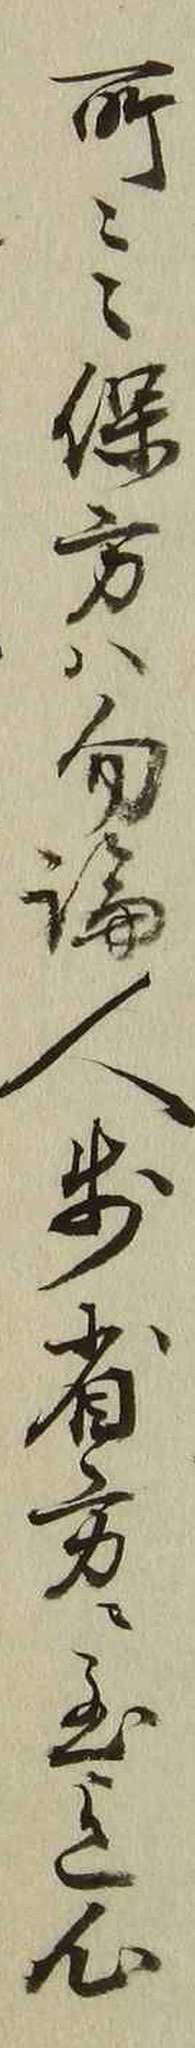所々々保方ハ勿論人歩省方ニ至迄心
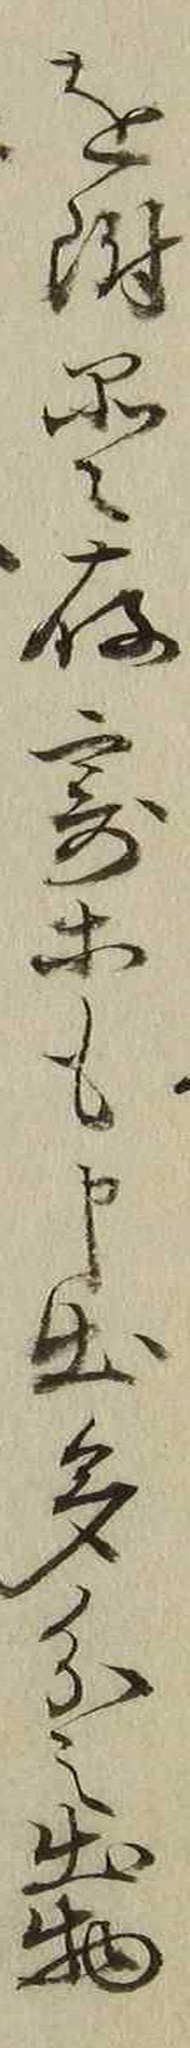を附品々存寄等も申出多分ミ出物
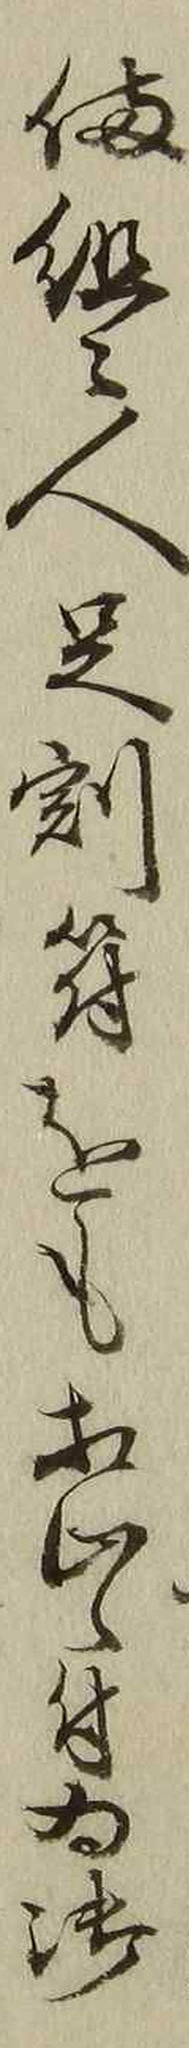備組々人足割符をも相止候付為御
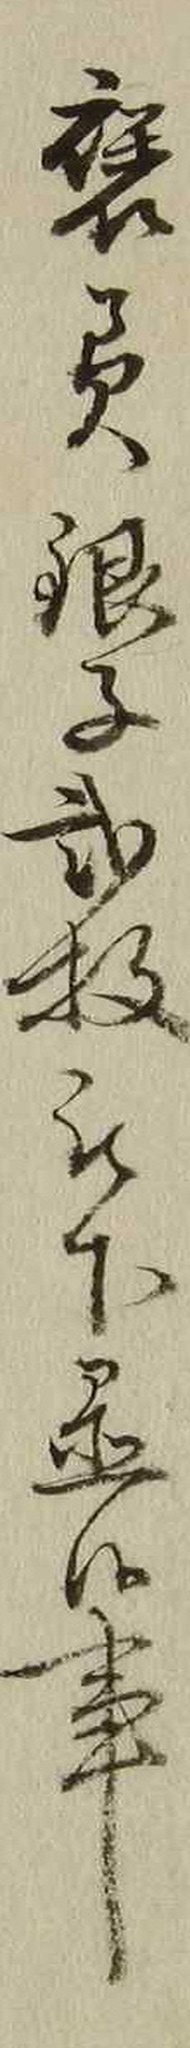褒美銀子弐枚被下置候事
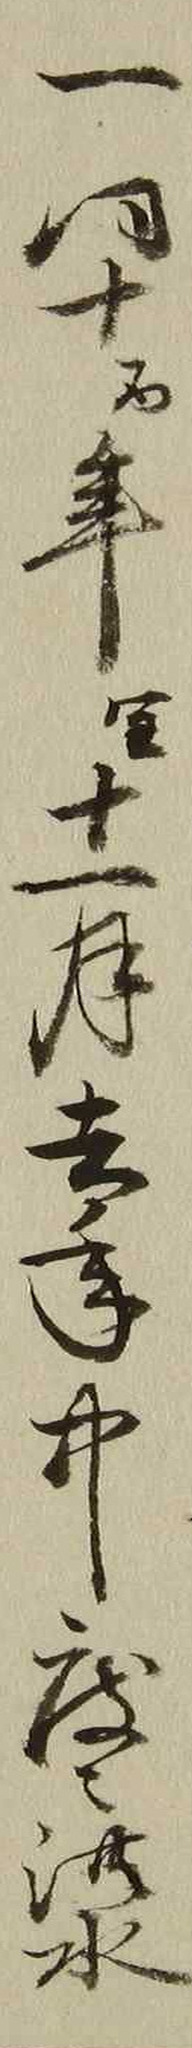一同十酉年閏十一月去年中度々法水
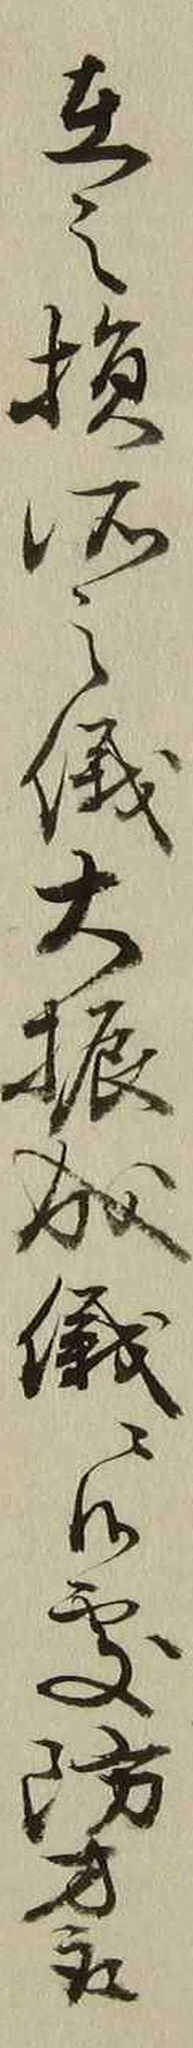在之損所之儀大振成儀ニ候処防方取
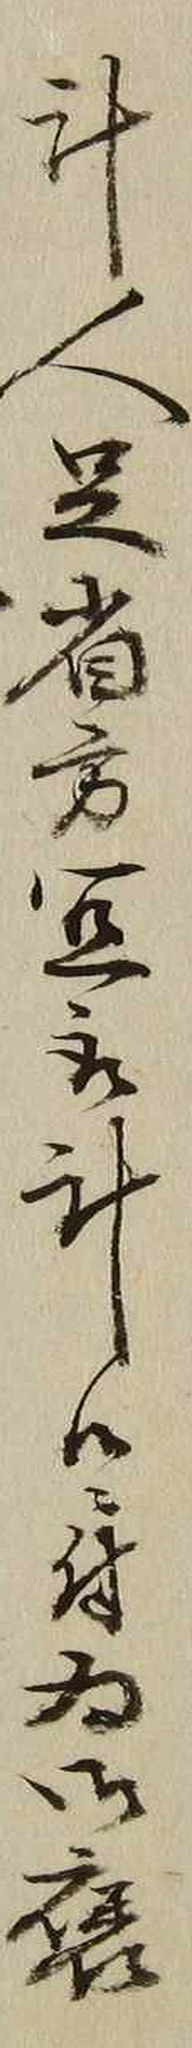計人足省方宜取計候ニ付為御褒
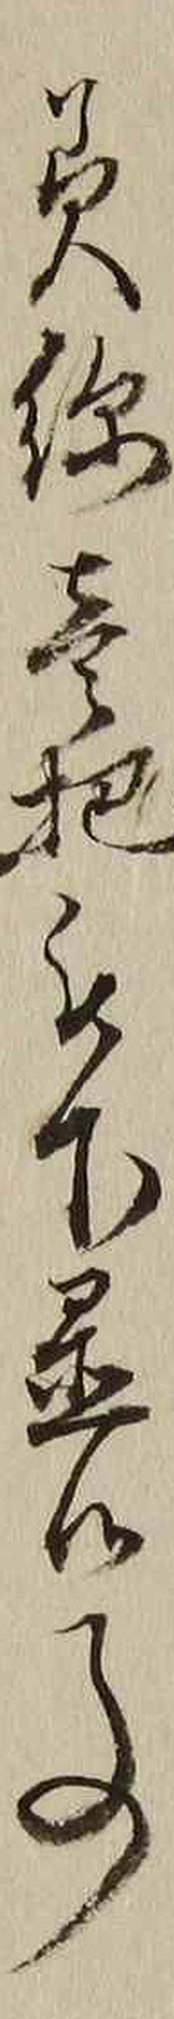美綿壱把被下置候事
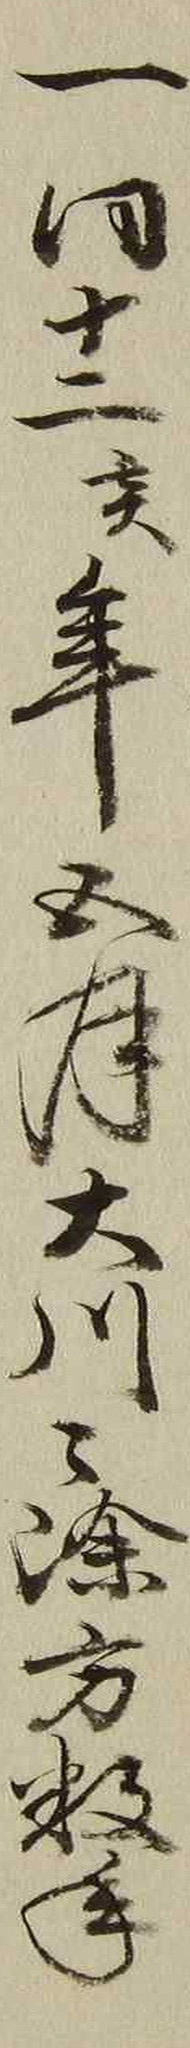一同十二亥年五月大川々除方数年
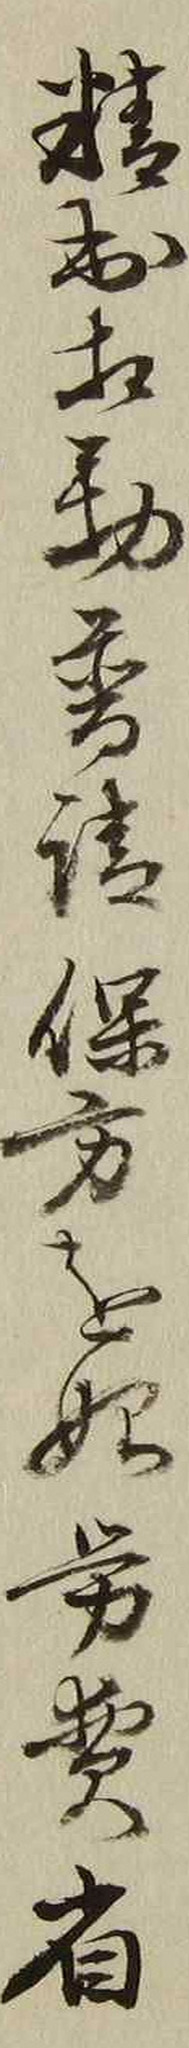精出相勤普請保方を始労費有省
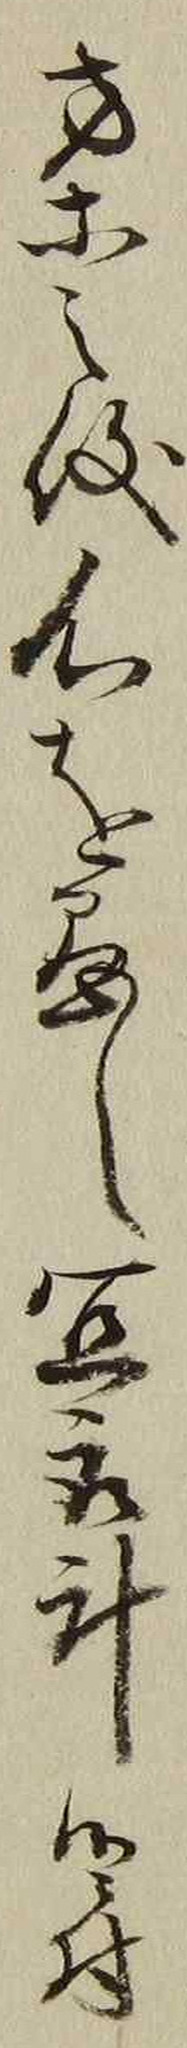方等之儀心を尽し宜取計候ニ付
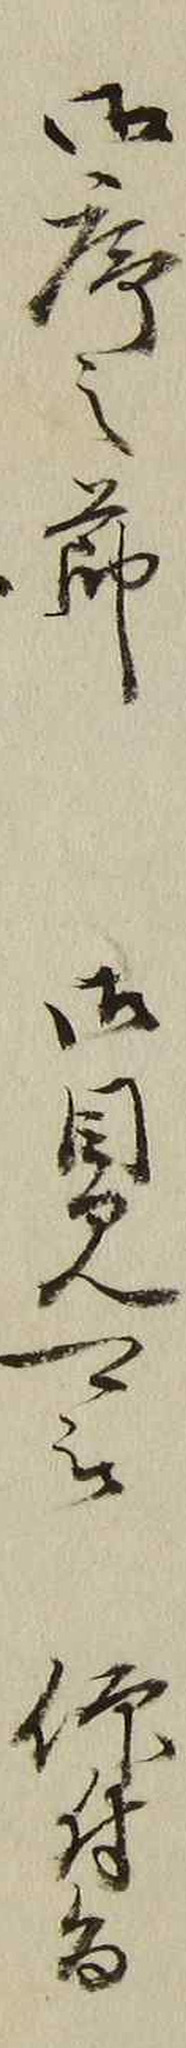御序之節御目見可被仰付旨
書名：諸士系譜　巻之36　は之部4
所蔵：会津若松市立会津図書館
